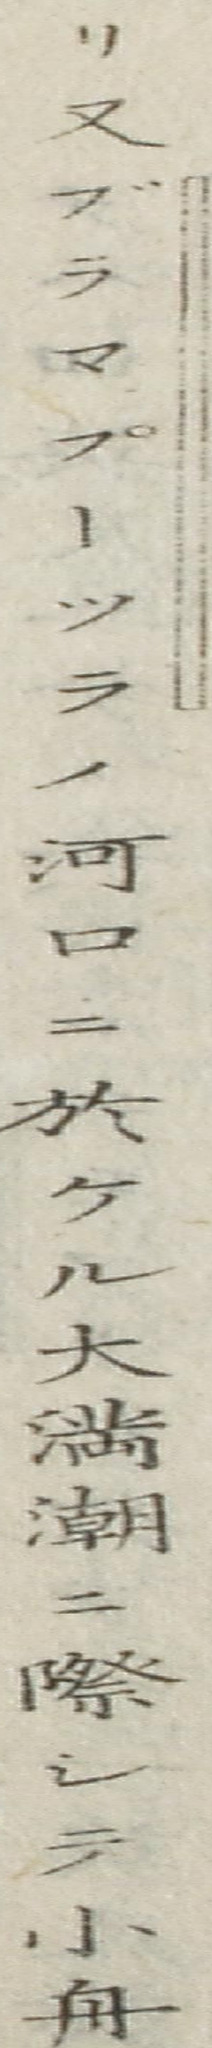リ又ブラマプーツラノ河口ニ於ケル大満潮ニ際シテ小舟
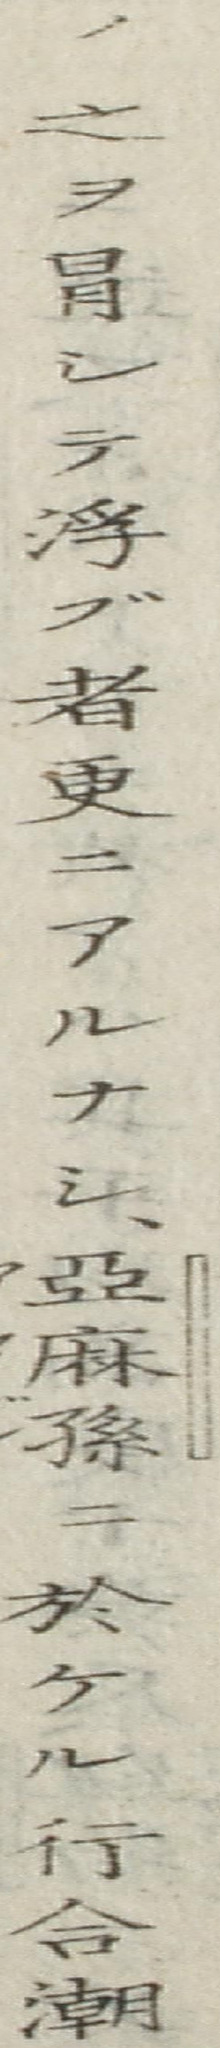ノ之ヲ冒シテ浮ブ者更ニアルナシ、亜麻孫ニ於ケル行合潮
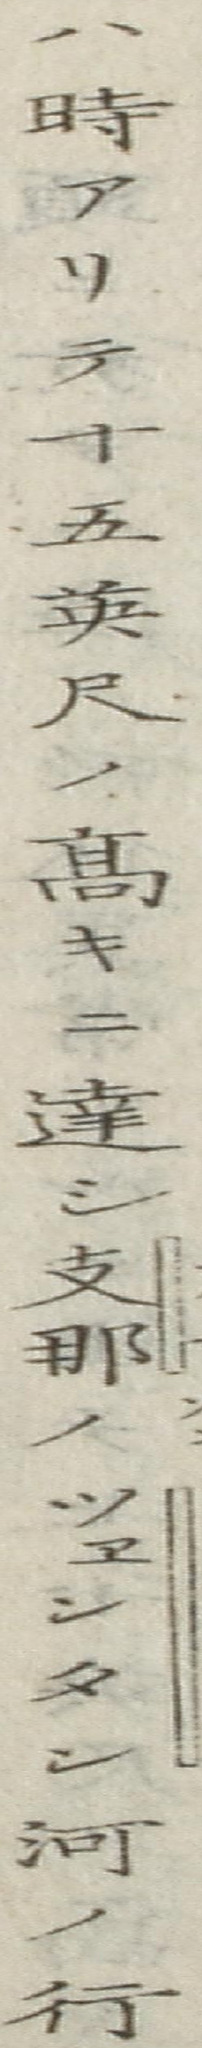ハ時アリテ十五英尺ノ高キニ達シ支那ノツェンタン河ノ行
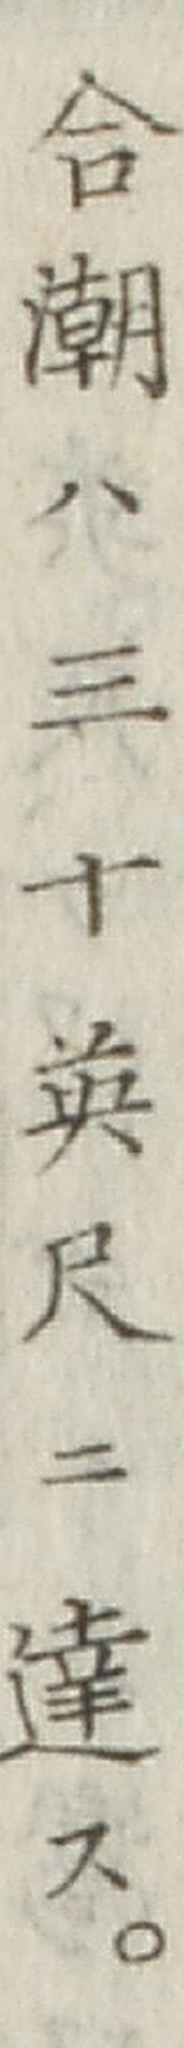合潮ハ三十英尺ニ達ス。
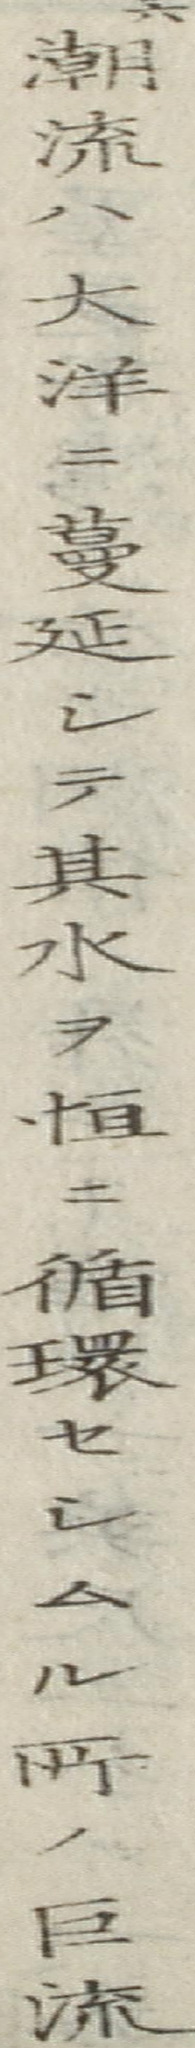廿六潮流ハ大洋ニ蔓延シテ其水ヲ恒ニ循環セシムル所ノ巨流
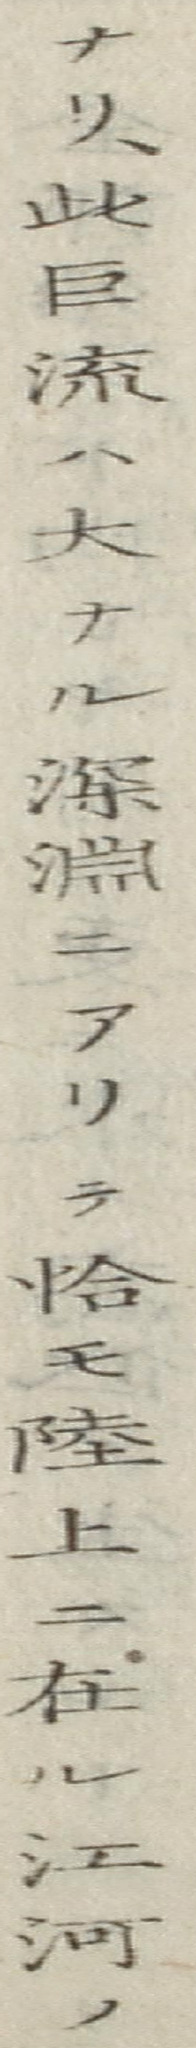ナリ、此巨流ハ大ナル深淵ニアリテ恰モ陸上ニ在ル江河ノ
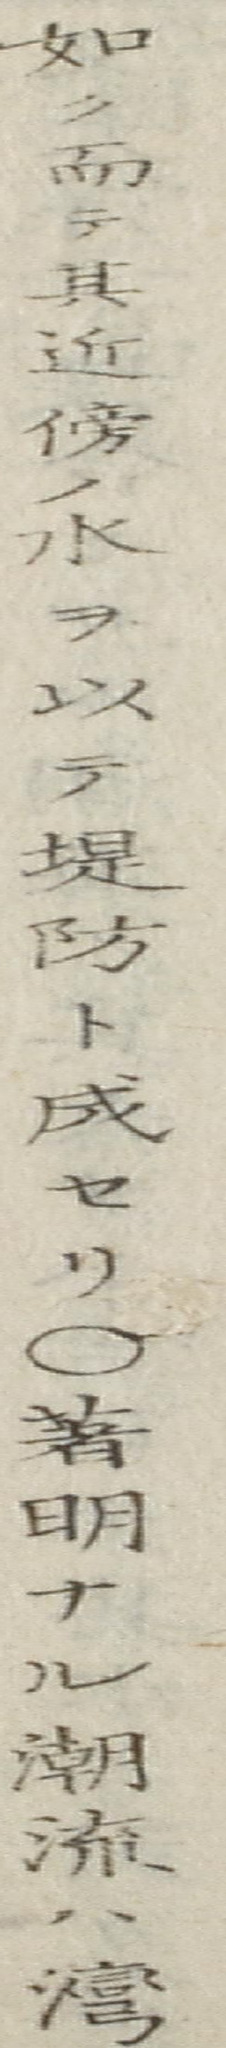如ク而テ其近傍ノ水ヲ以テ堤防ト成セリ○著明ナル潮流ハ湾
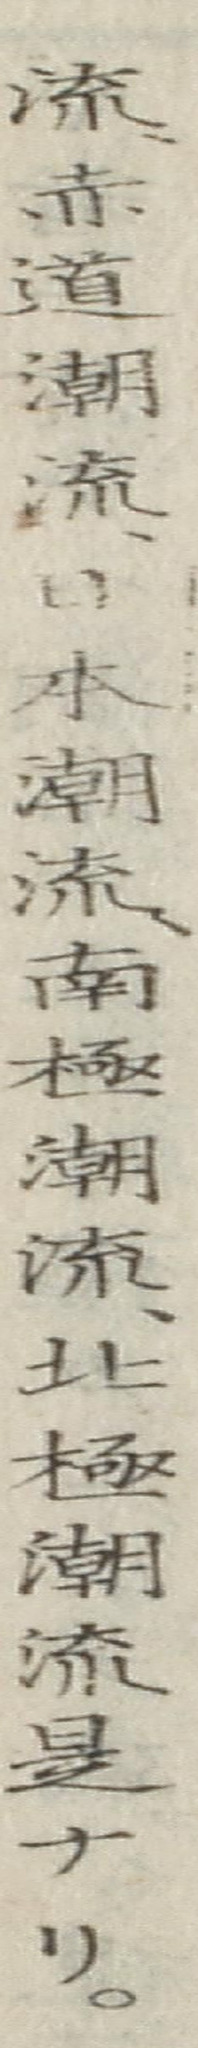流、赤道潮流、日本潮流、南極潮流、北極潮流是ナリ。
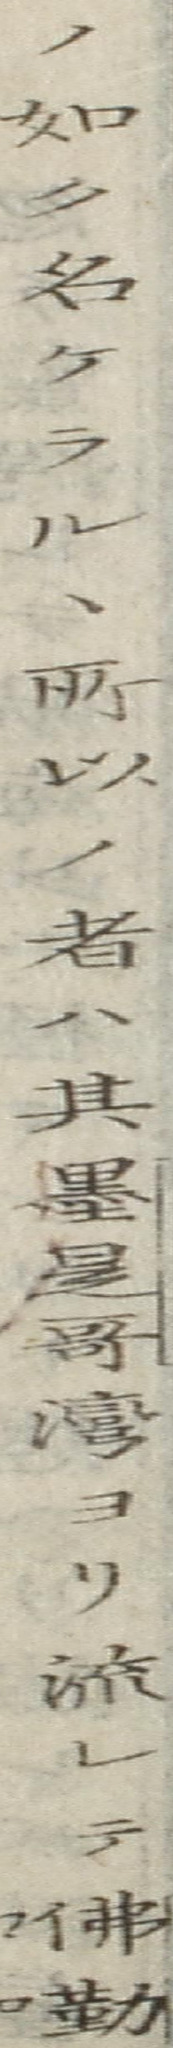ノ如ク名ケラルヽ所以ノ者ハ其墨是哥湾ヨリ流レテ佛勤
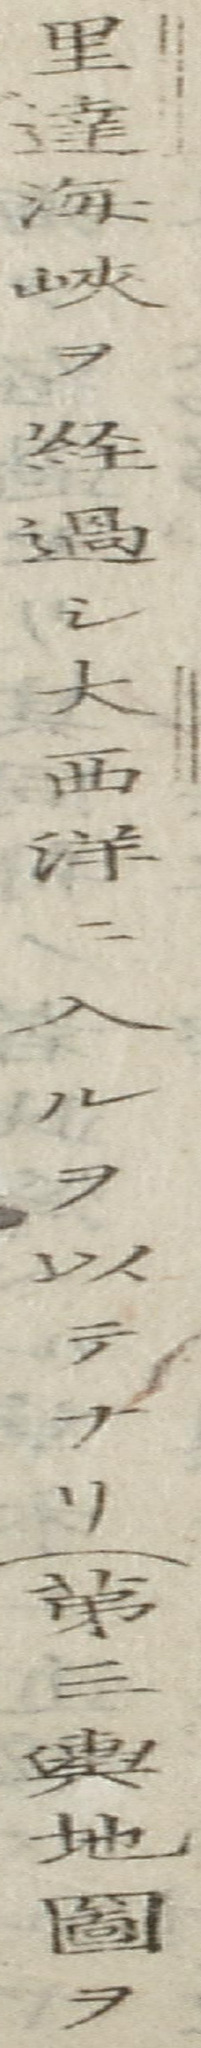里達海峡ヲ経過シ大西洋ニ入ルヲ以テナリ（第三輿地図ヲ
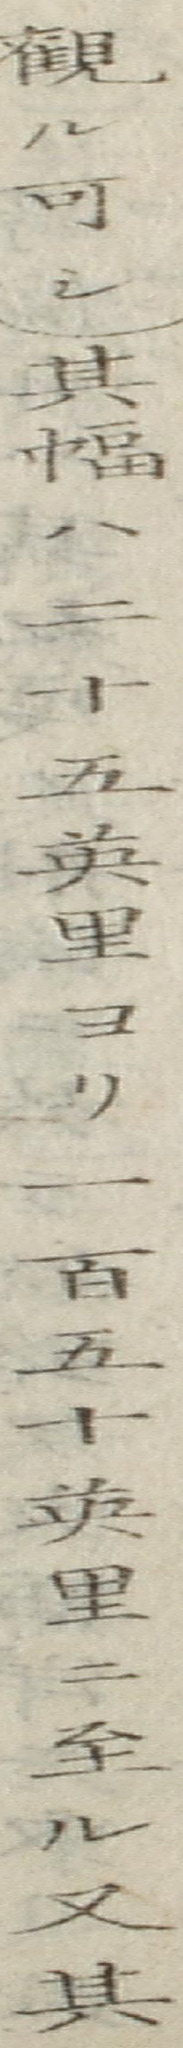観ル可シ）其幅ハ二十五英里ヨリ一百五十英里ニ至ル又其
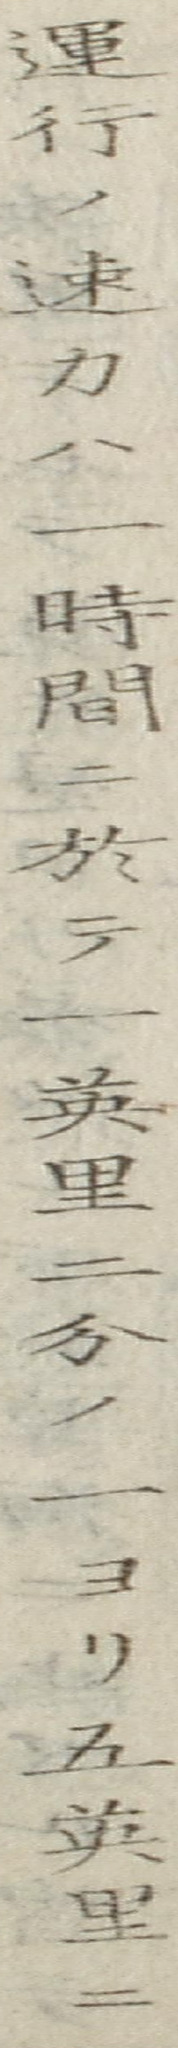運行ノ速力ハ一時間ニ於テ一英里ニ分ノ一ヨリ五英里ニ
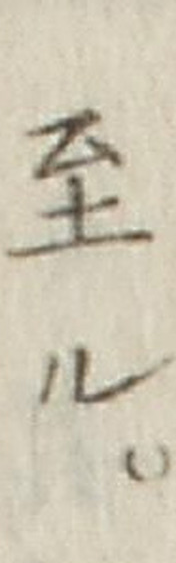至ル。
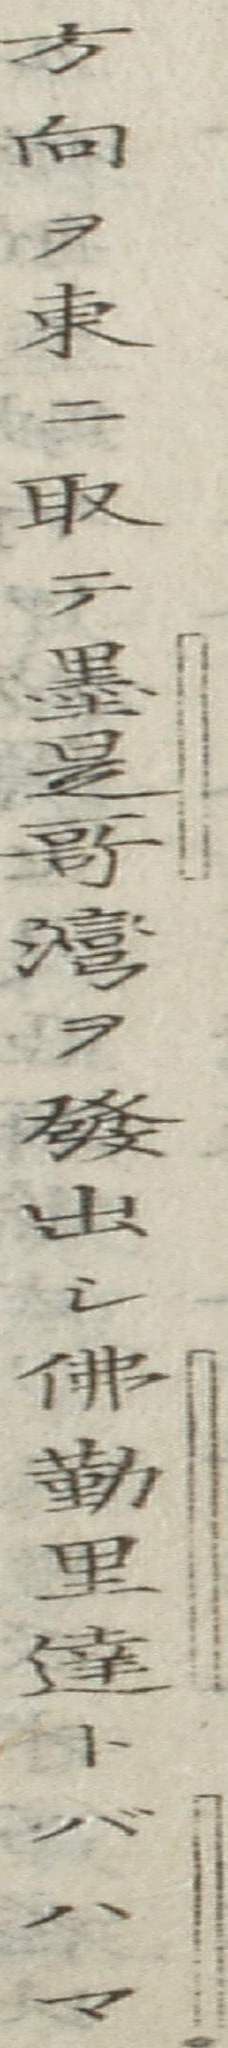方向ヲ東ニ取テ墨是哥湾ヲ発出シ佛勤里達トバハマ
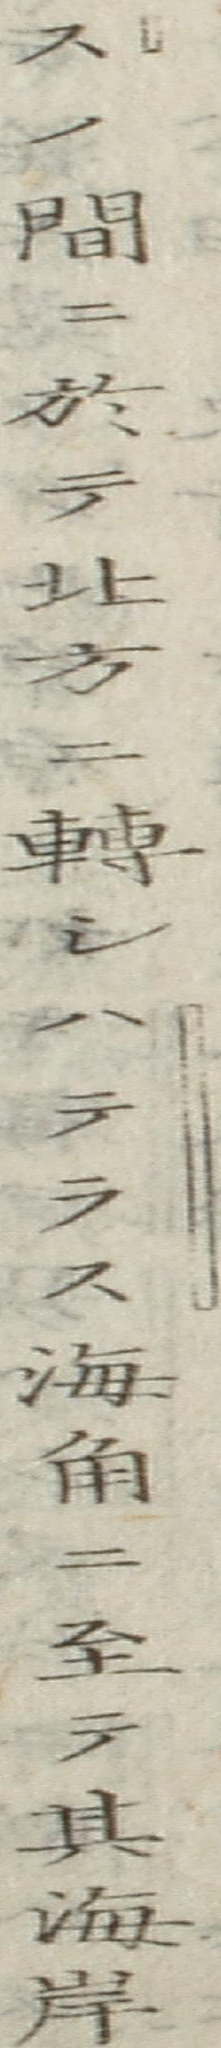スノ間ニ於テ北方ニ転シハテラス海角ニ至テ其海岸
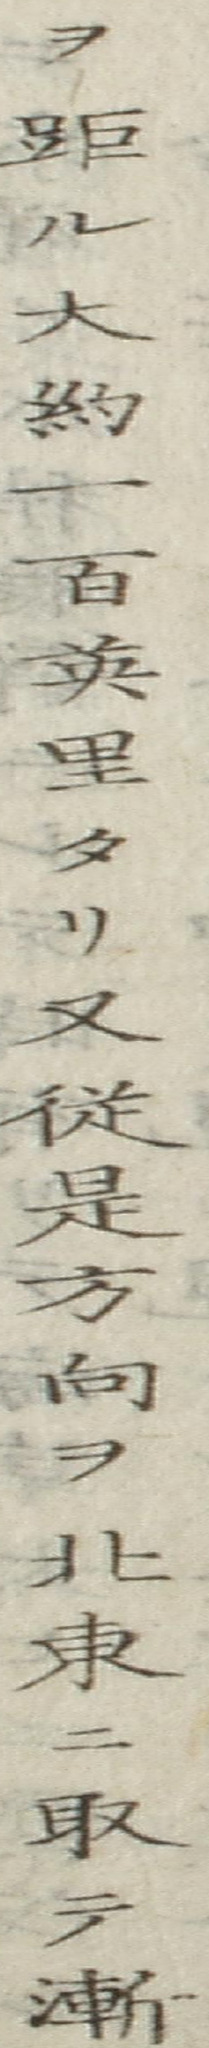ヲ距ル大約一百英里タリ又従是方向ヲ北東ニ取テ漸
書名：地形論　巻二
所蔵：東京大学地震研究所図書室 Earthquake Research Institute Library, The University of Tokyo, JAPAN
